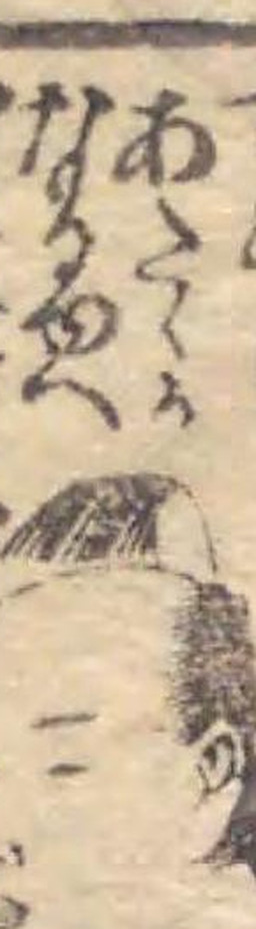なるゆへ
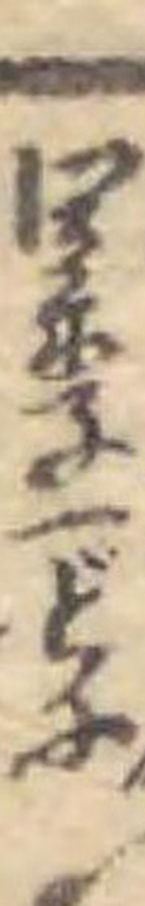四季一どに
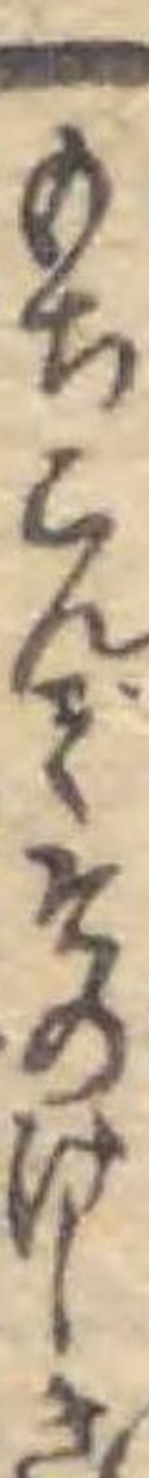もちこんでそのけしき
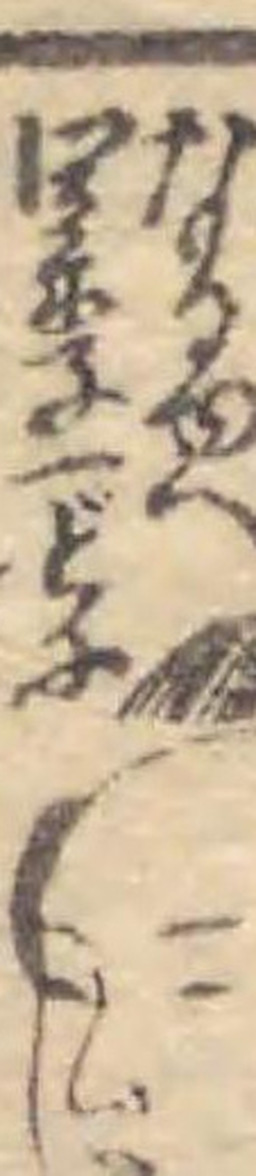四季一どに
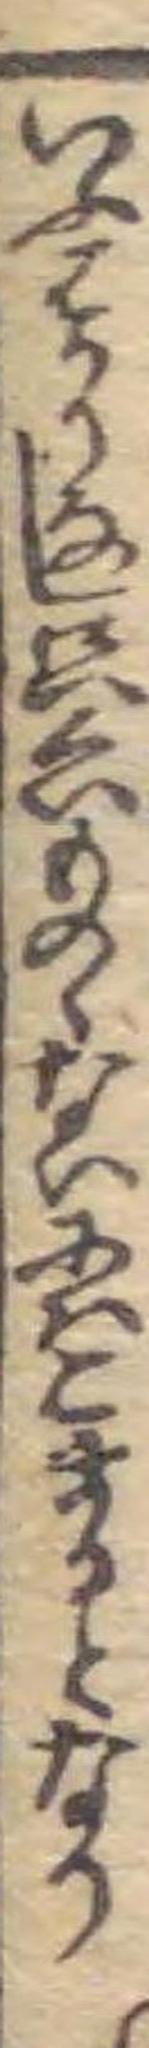いふはかりなし只くいものゝないにはこまるとなり
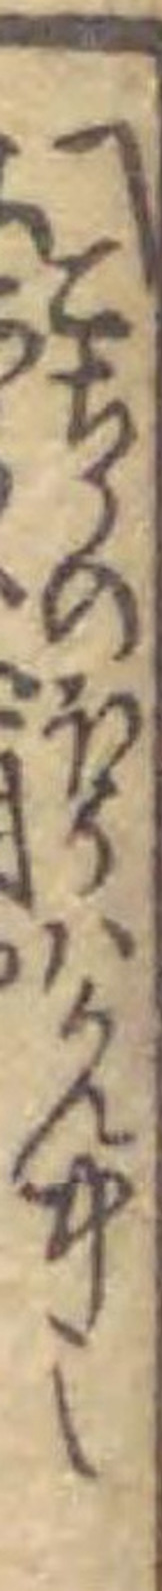〽こちらのほうはかん中也
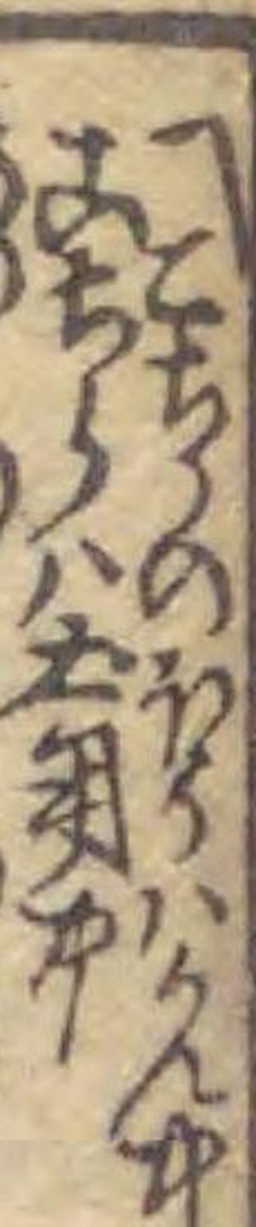あちらは土用中
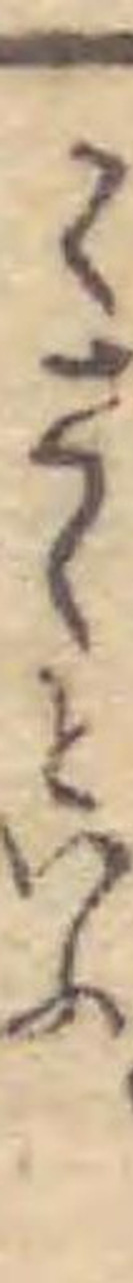くさくといふ
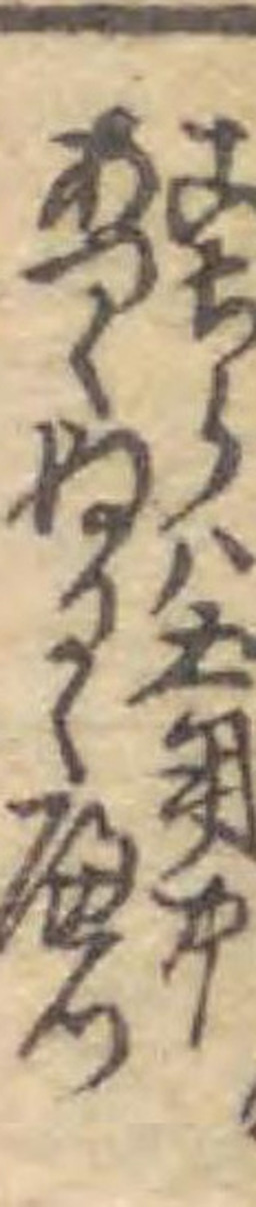あつくぬるくへつ
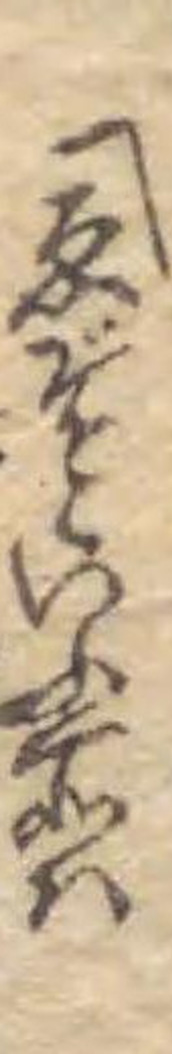〽ゑぞといふ所は
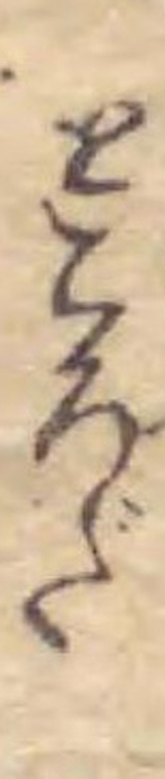ところだ
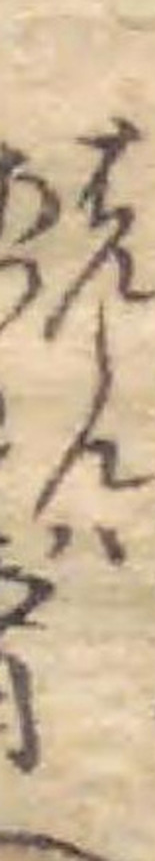はんしんは
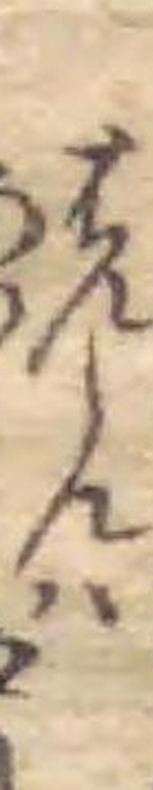はんしんは
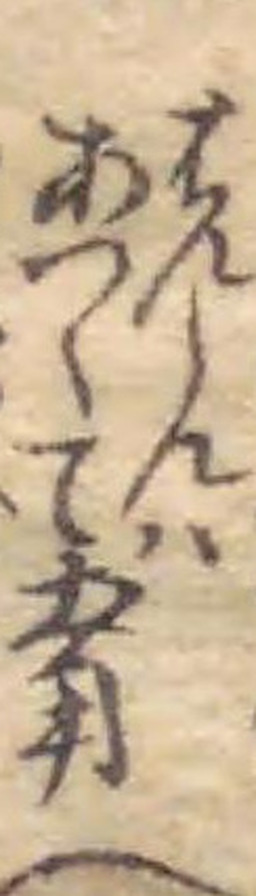あつくて土用
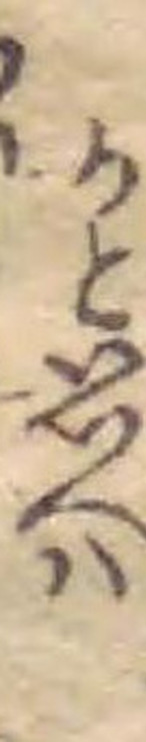かと思へは
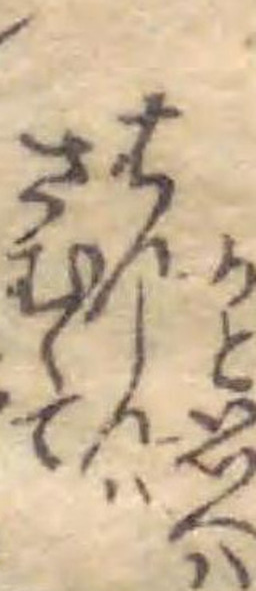はんしんは
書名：悦贔負蝦夷押領 : 3巻
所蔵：国立国会図書館 National Diet Library, JAPAN
